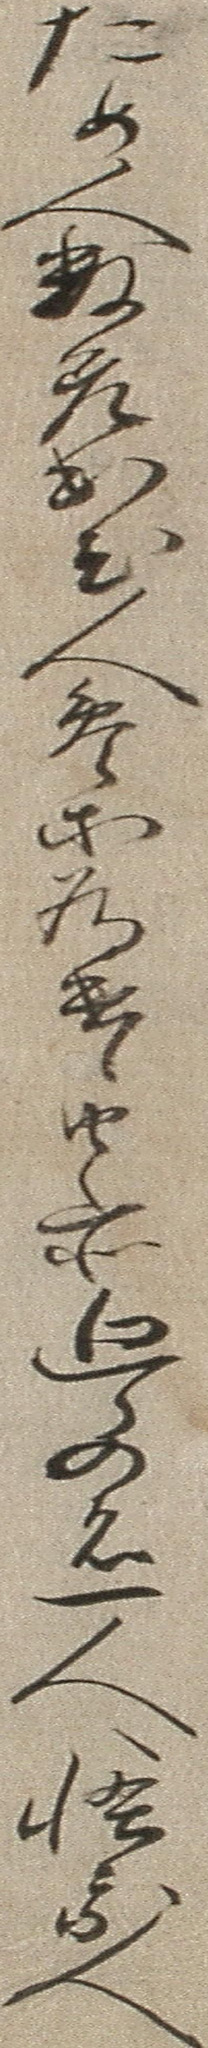ため人数差出置人参等為遣候由之所廻りの者一人へ怪我人
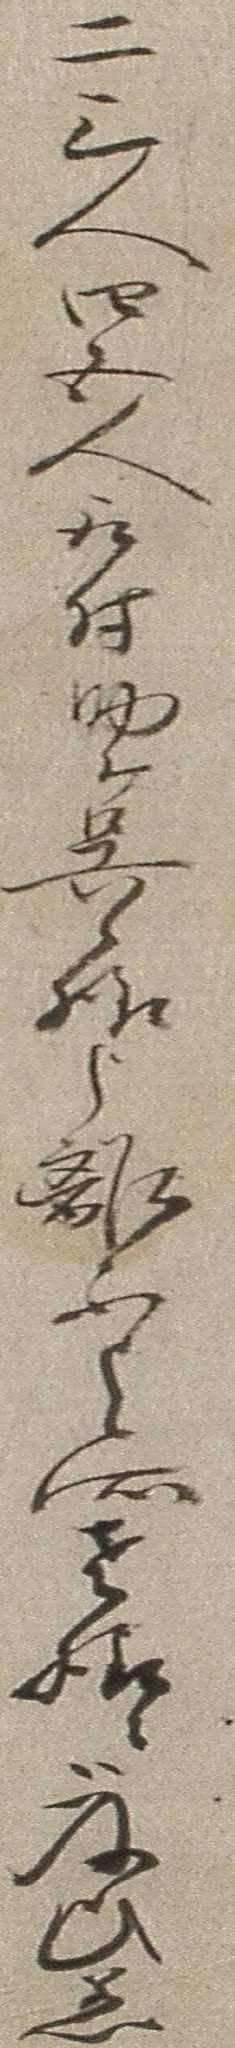二三人四五人取付助ヶ呉候様申離不申候所左様には及ひ兼
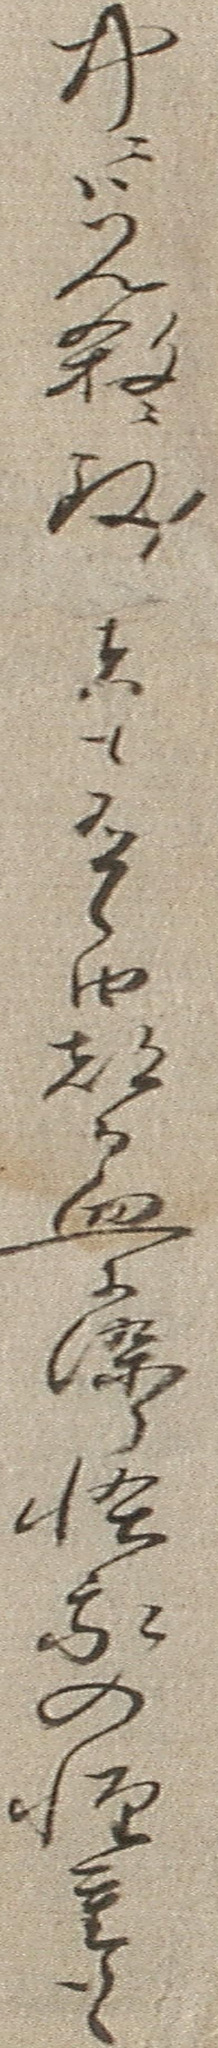中には見殺に致候者も有候由都而血に染り怪我の軽重も
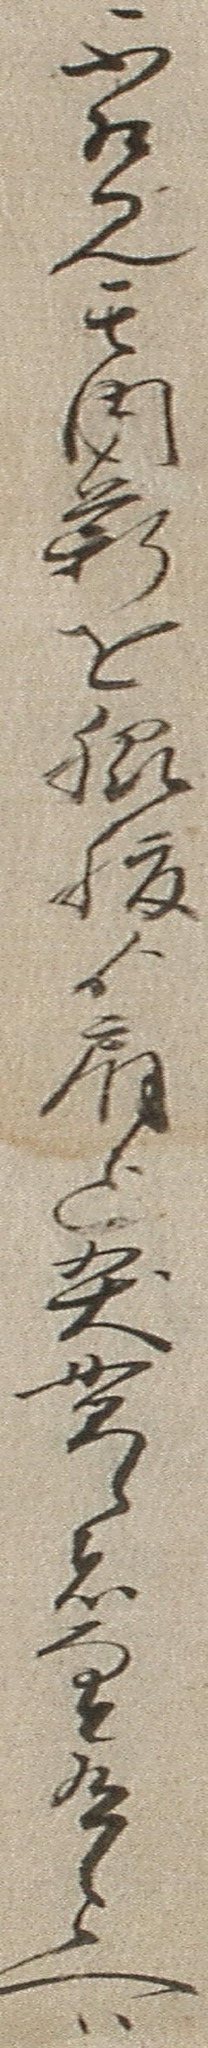不相見其内薪を脇腹ゟ肩迄突貫候者なと有之候へは
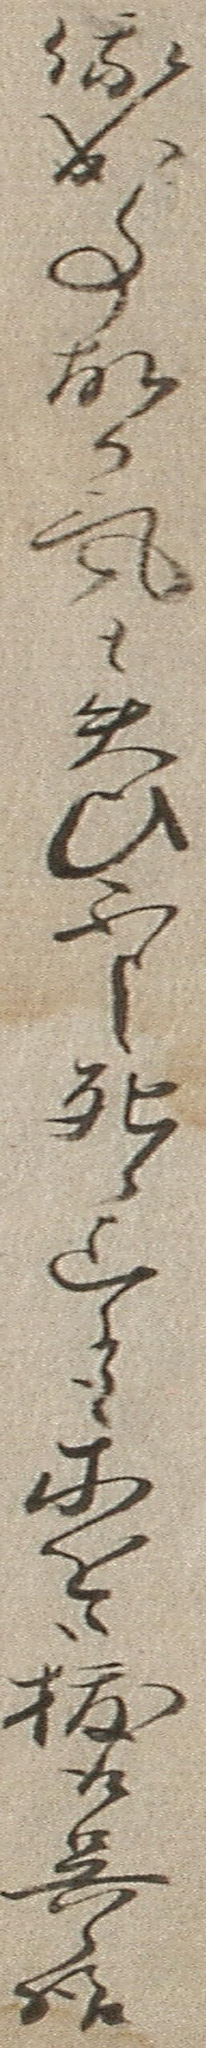俄成事故か気も失ひ不申死候迄にも木をは抜取呉候様
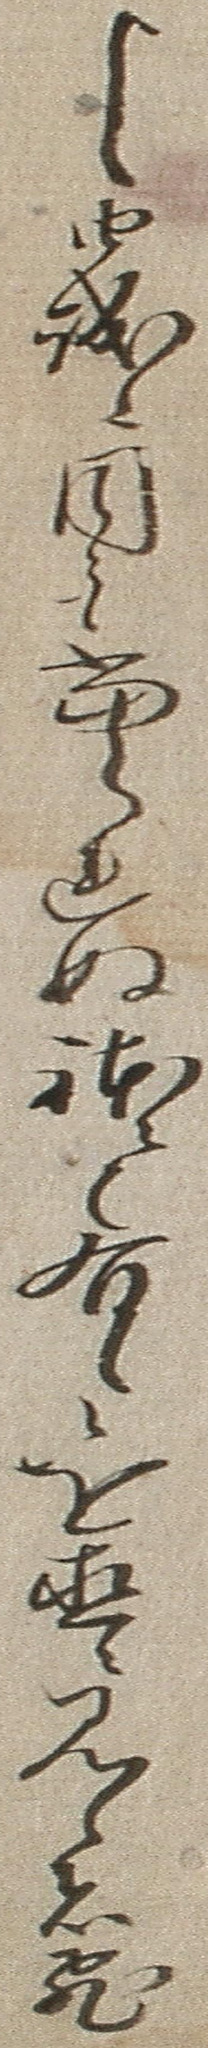申候由誠に目も当られぬ体にて有之候を直に見候者飛
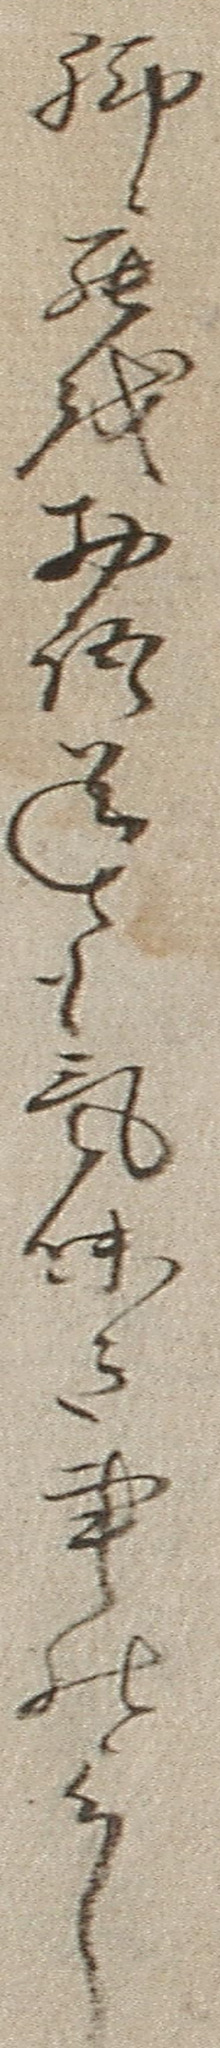脚に罷越物語承候も気味き事のよし
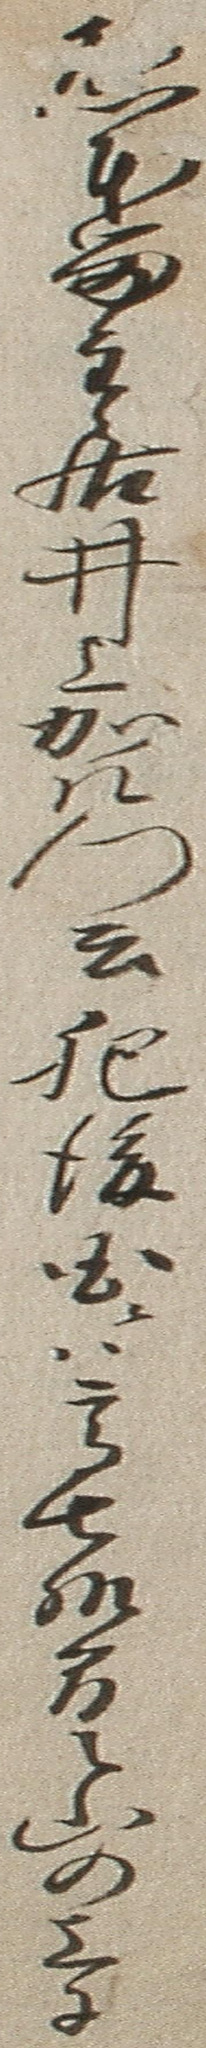熊本留守居井上加左衛門云肥後国には高七拾間之山の上に
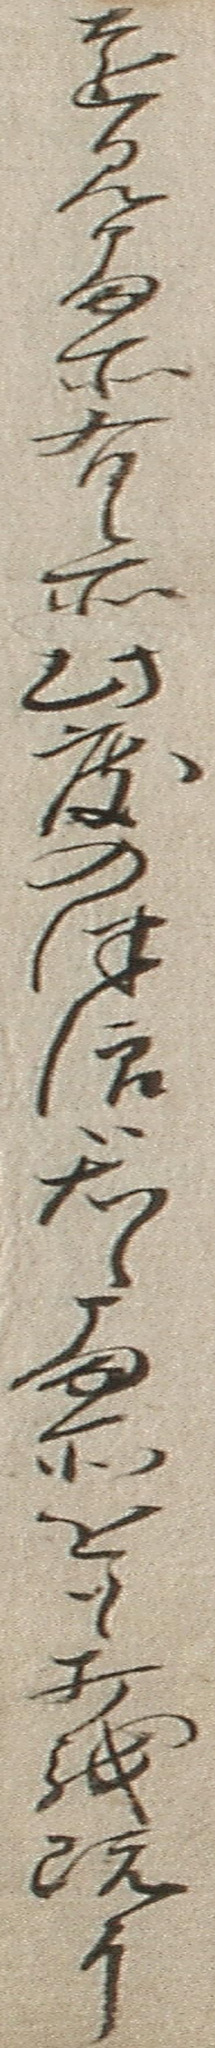遠見番所有之候所此度の津浪は右之番所をも打越既に

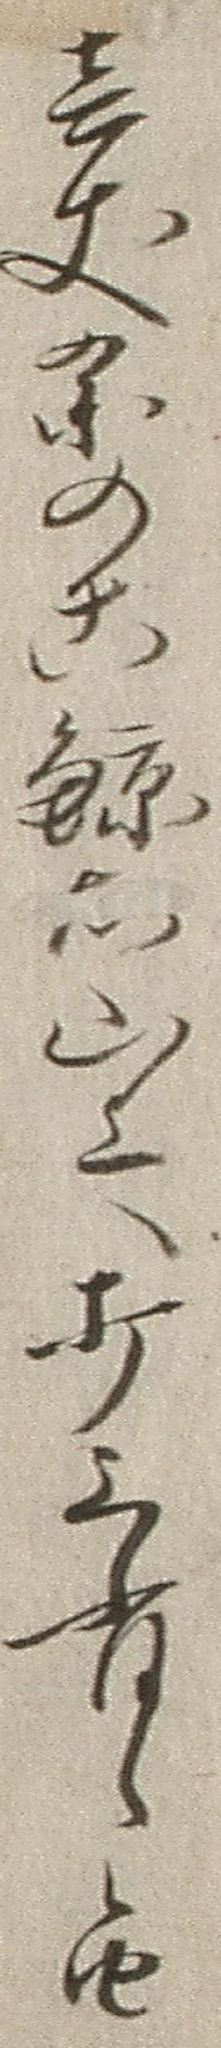壱丈余の古鯨右山上へ打上有之候由
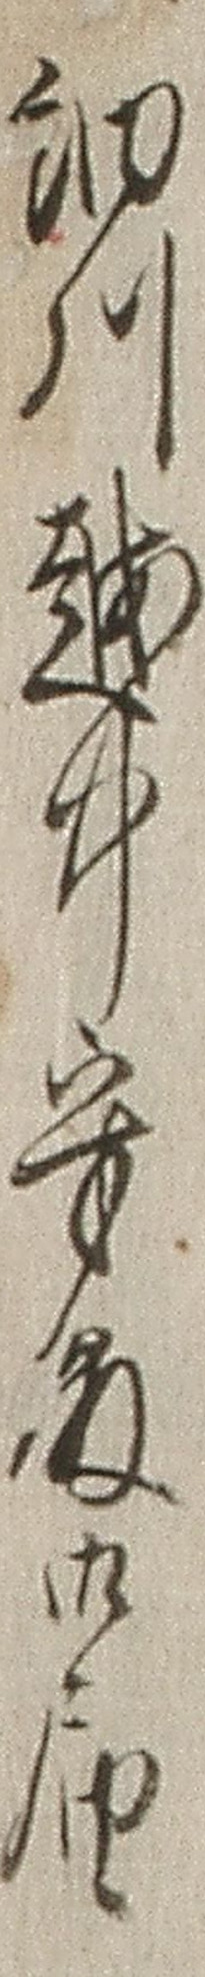細川越中守殿御届
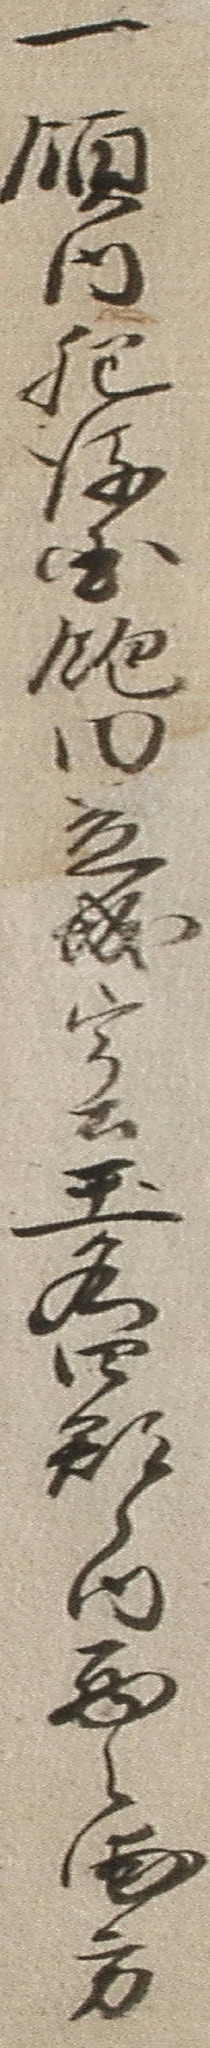一領内肥後国飽田益城宇土玉名四郡之内西之浦方
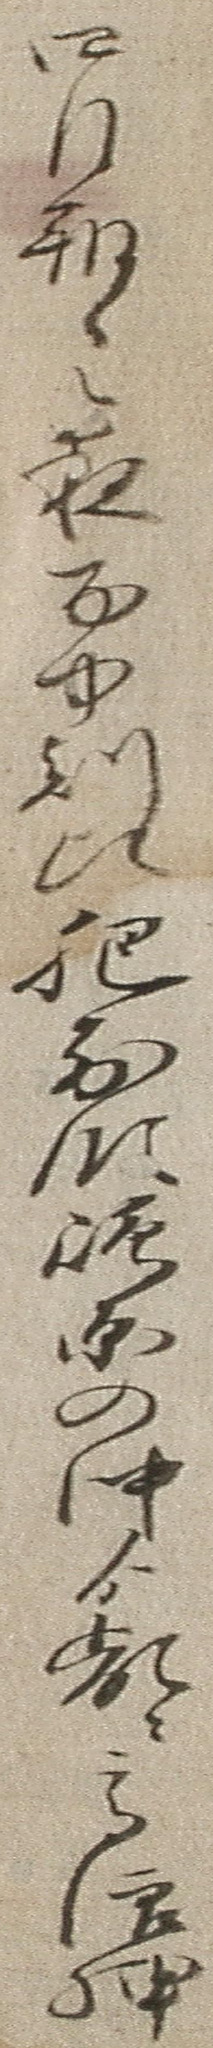四月朔日之夜酉中刻頃肥前領島原の沖ゟ頻に高浪押
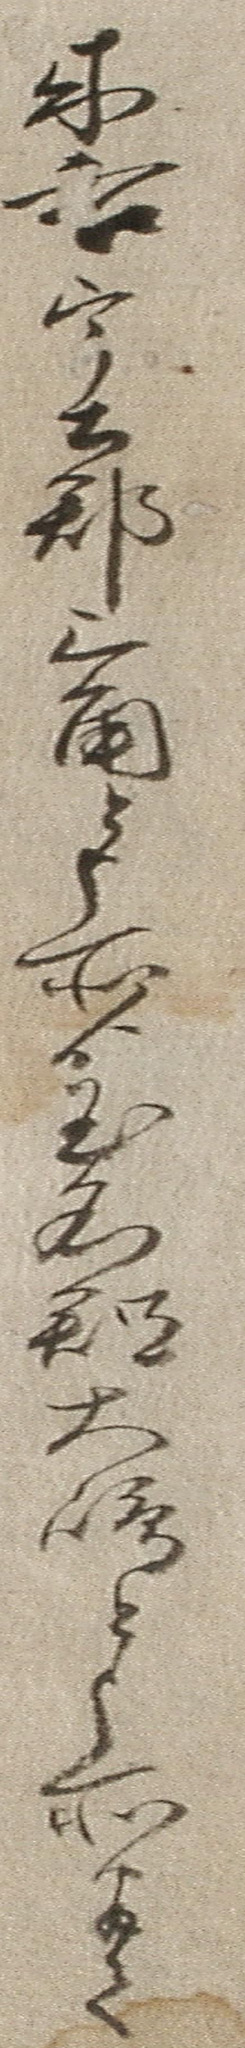来右宇土郡三角と申所ゟ玉名郡大嶋と申所まて
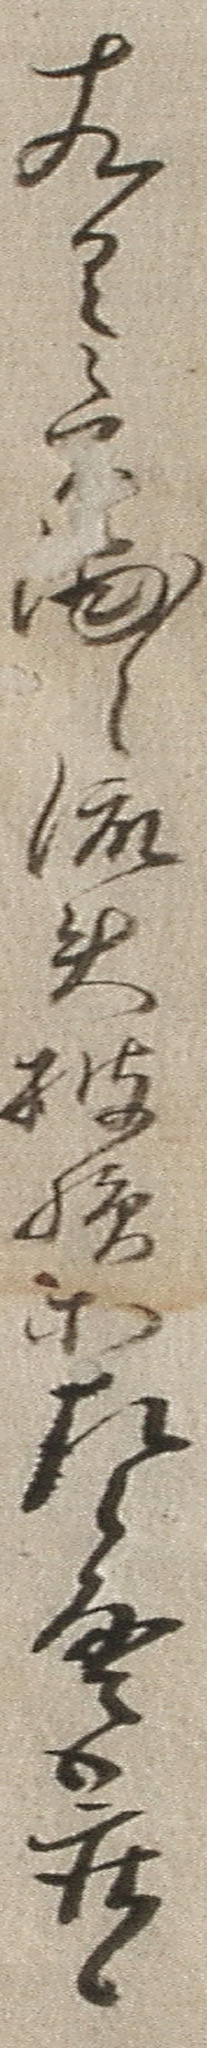十九里之間浦々流失破損等左之通に御座候
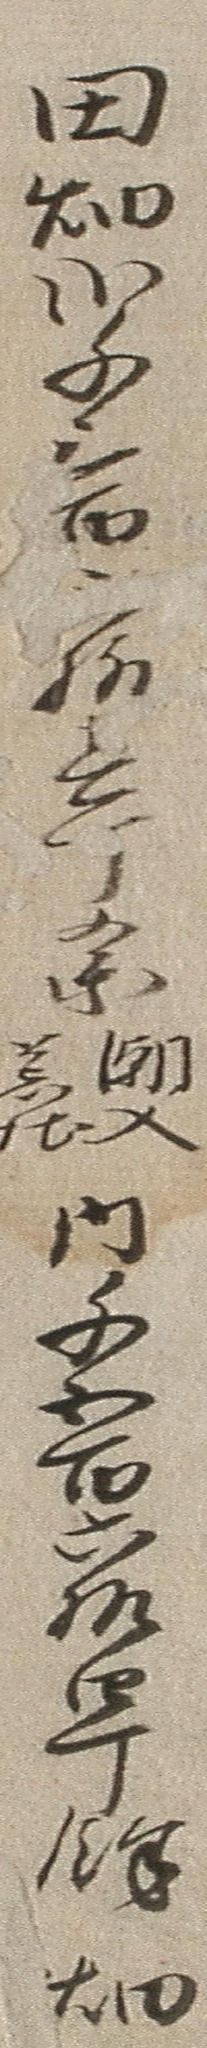一田畑弐千三百拾壱丁余潮入荒地内千五百六拾四丁余畑
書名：太平秘録抜書　浅間山燒及普賢山崩
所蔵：東京大学地震研究所図書室 Earthquake Research Institute Library, The University of Tokyo, JAPAN
